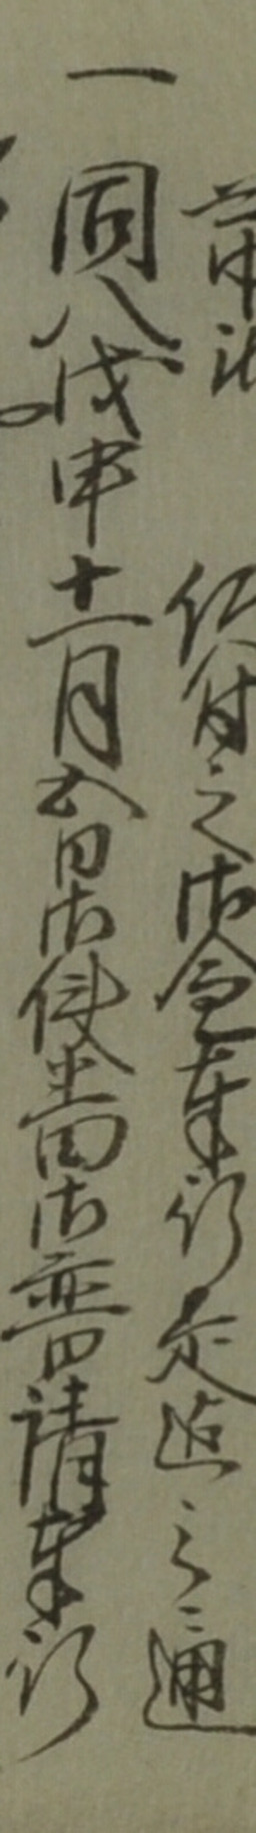一同八戌申十一月五日御使番御普請奉行
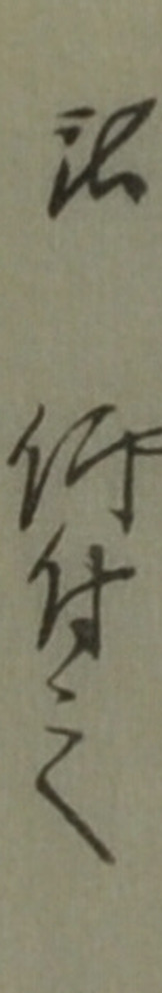被仰付之
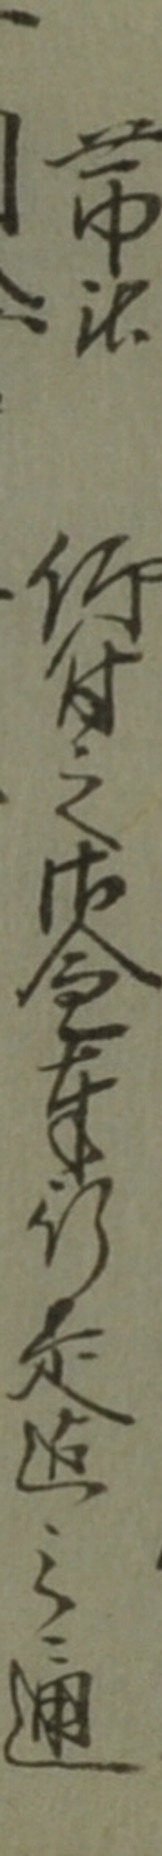帯被仰付之御金奉行是迄之通
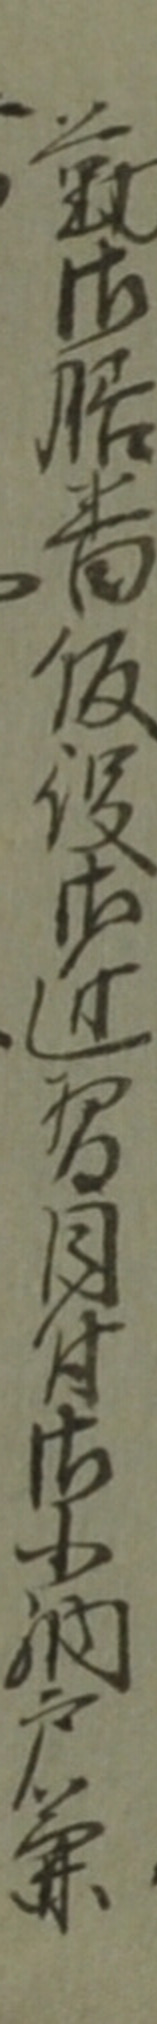勤御膳番仮役御近習目付御小納戸兼
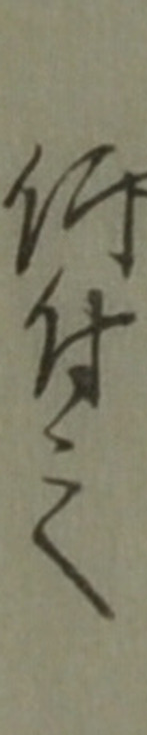仰付之
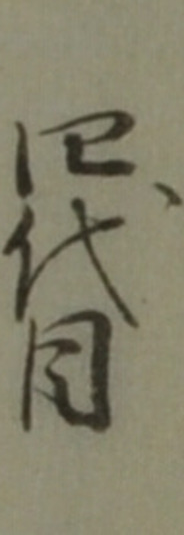四代目
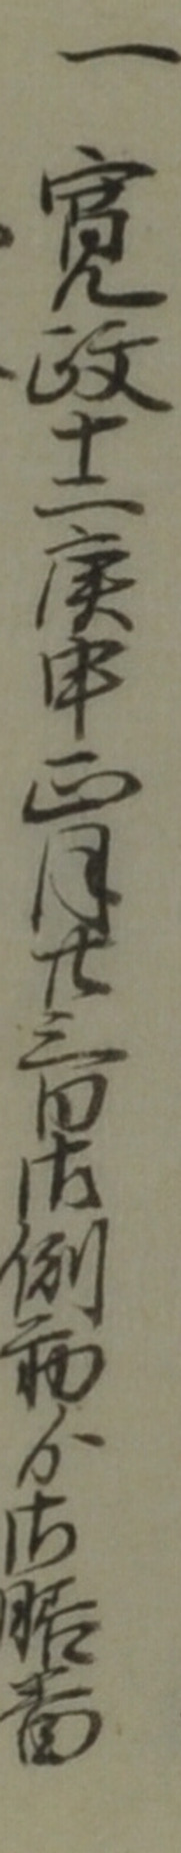一寛政十二庚申正月廿三日御側勤ゟ御膳番
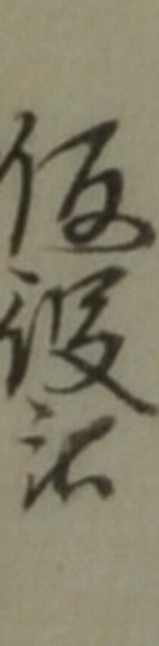仮役被
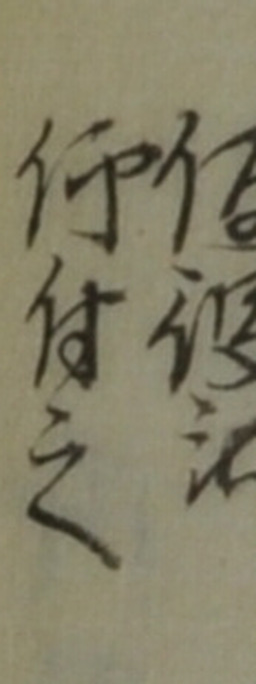仰付之
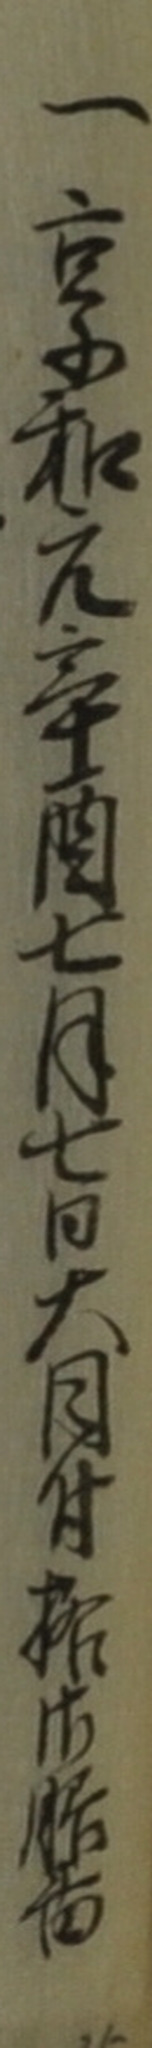一享和元辛酉七月七日大目付格御膳番
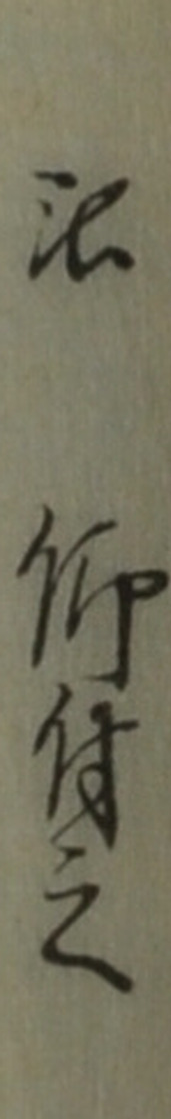被仰付之
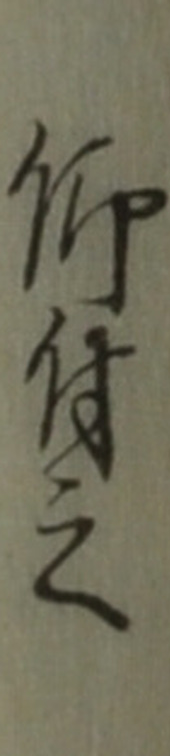仰付之
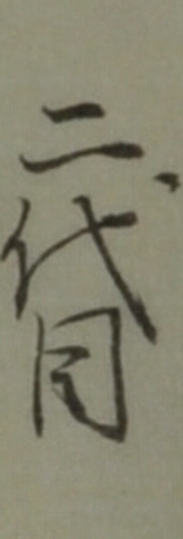二代目
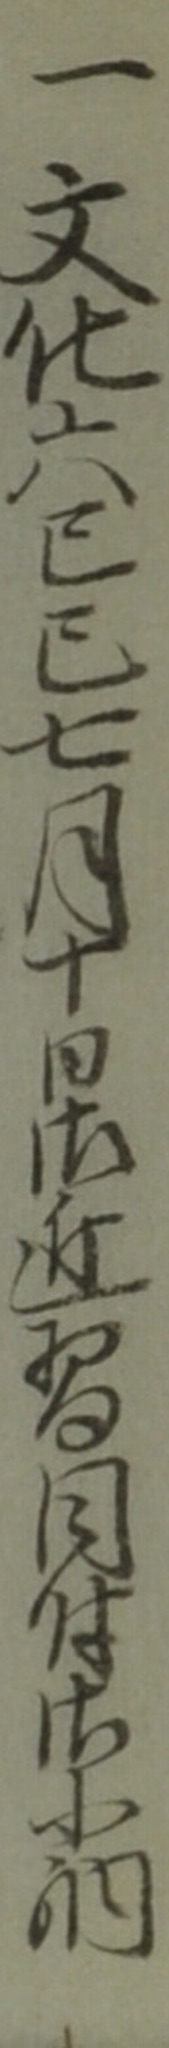一文化六己巳七月十日御近習目付御小納
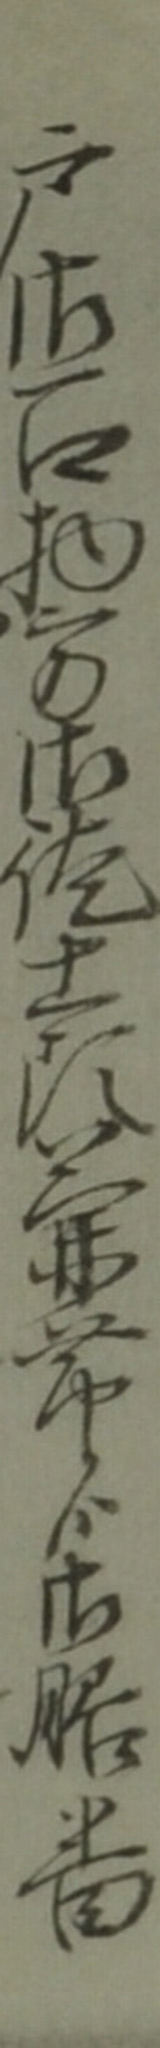戸御召物方御徒士頭兼帯ゟ御膳番
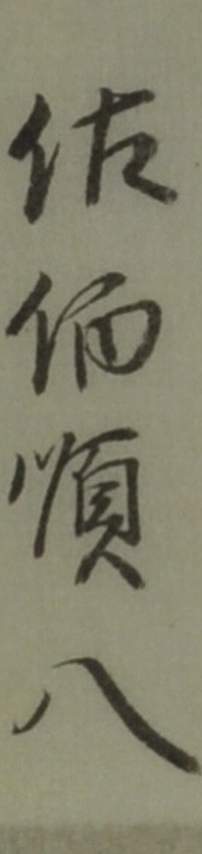佐伯順八
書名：諸御役代々録（四）
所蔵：伊那市立高遠町図書館・合同会社AMANE
